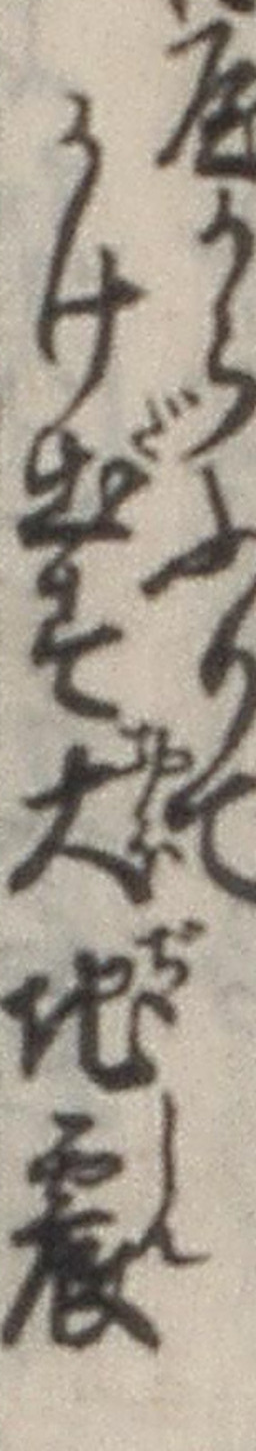かけ出す大地震
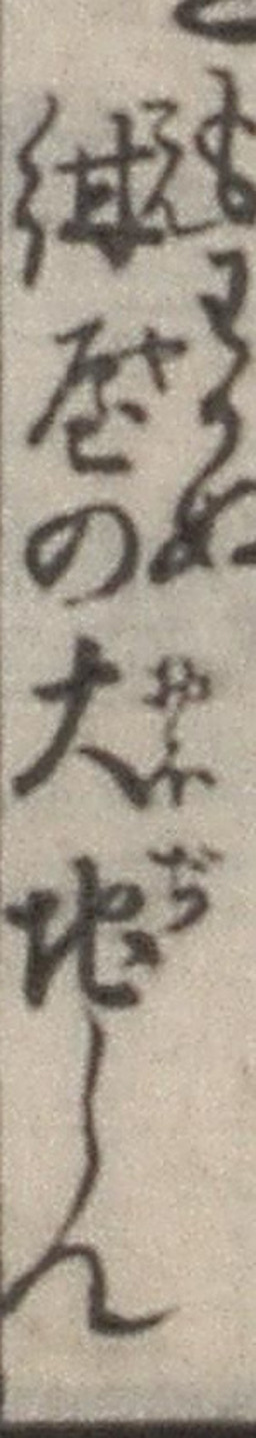紺屋の大地しん
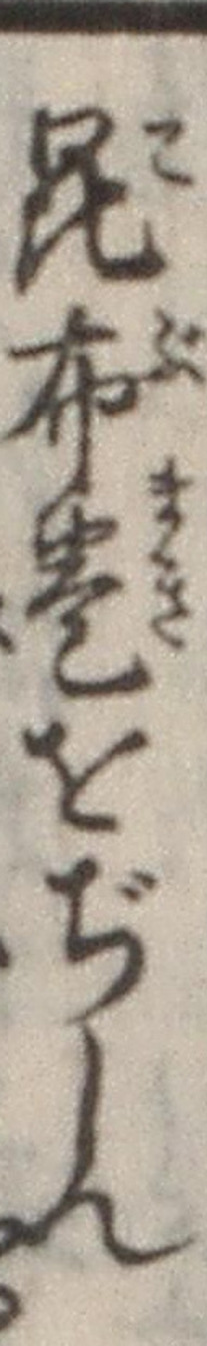昆布巻をぢしん
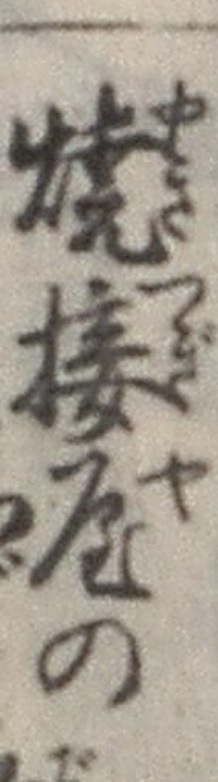焼接屋の
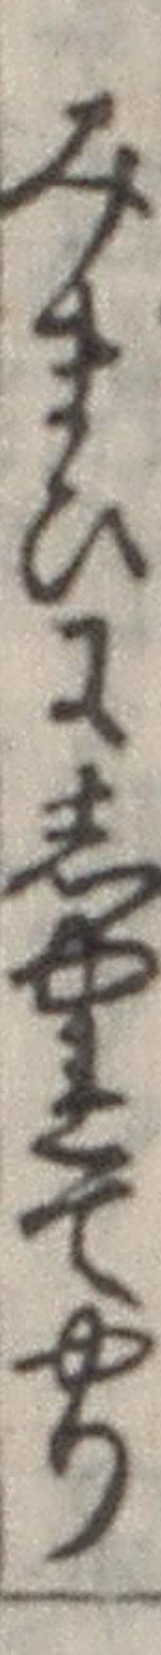みまひにしやれてやり
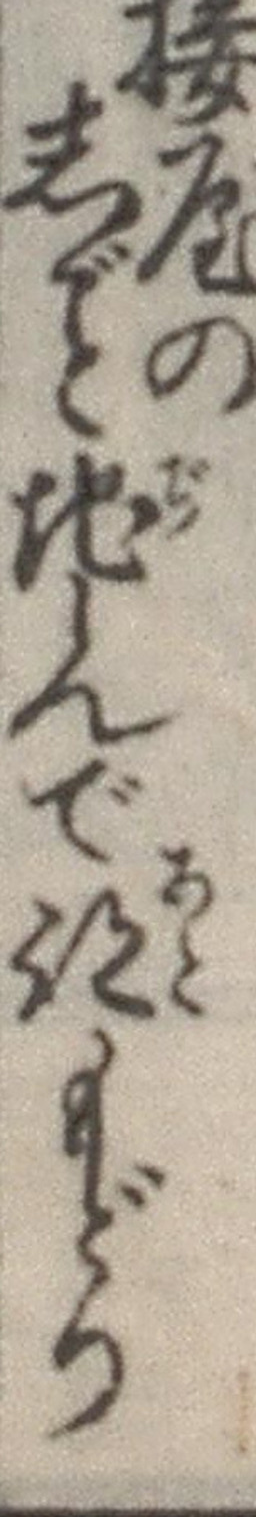しごと地しんで跡もどり
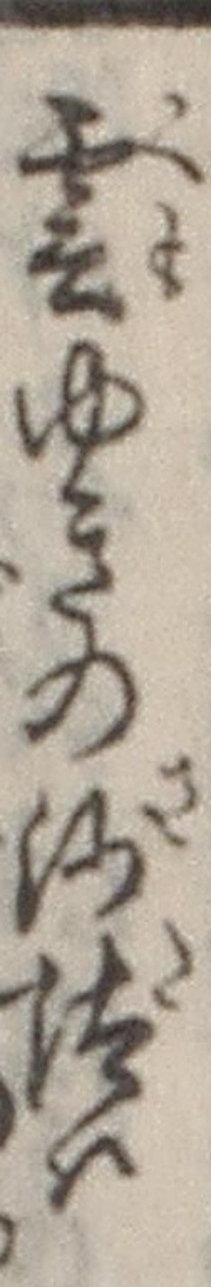雲ゆきの沙汰は
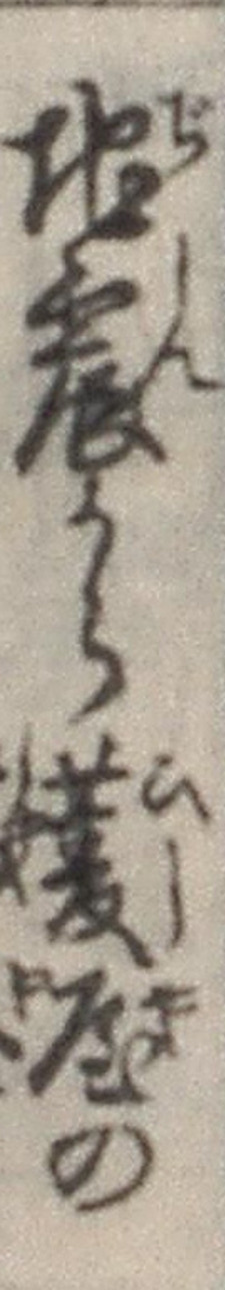地震から菱屋の
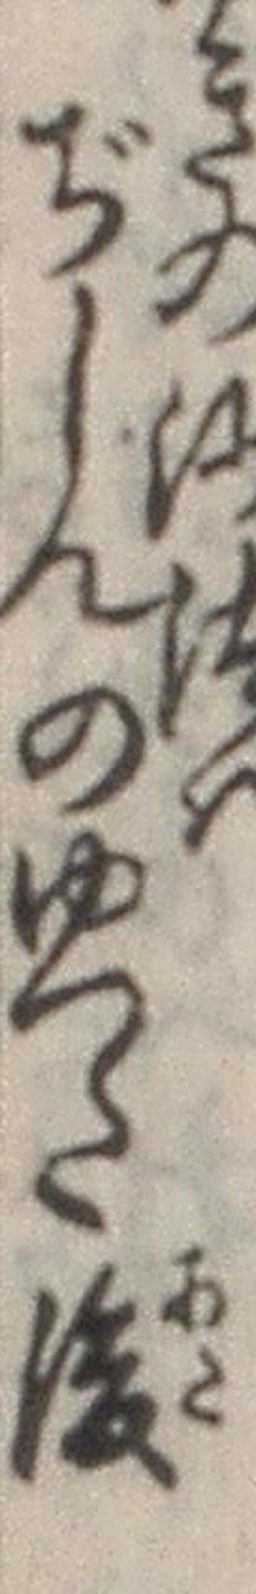ぢしんのゆつた後
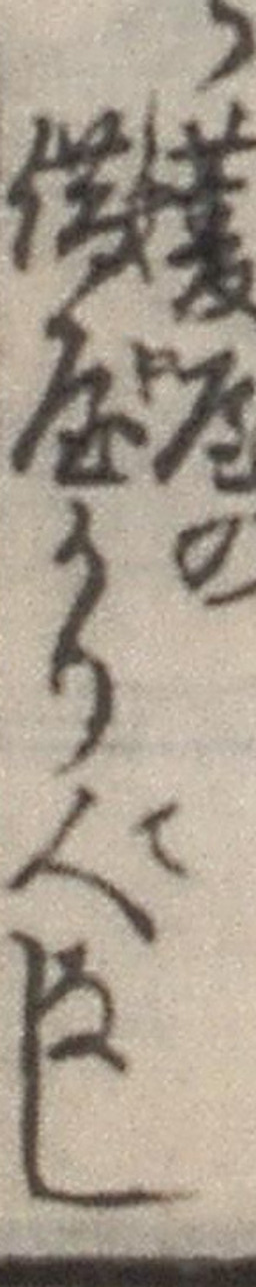借屋かり人なし
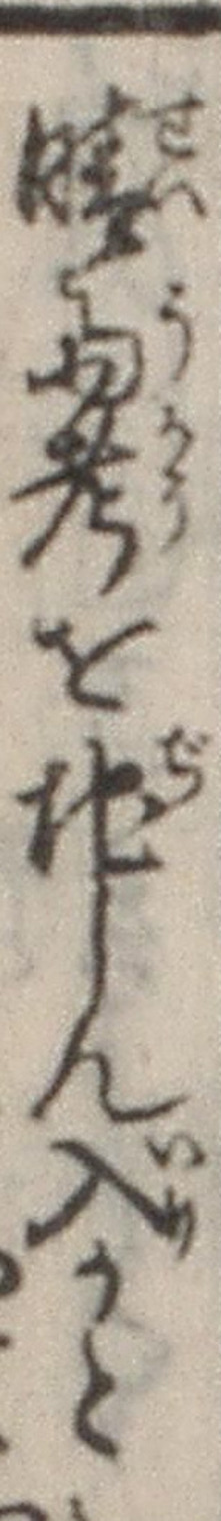晴雨考を地しん入かと
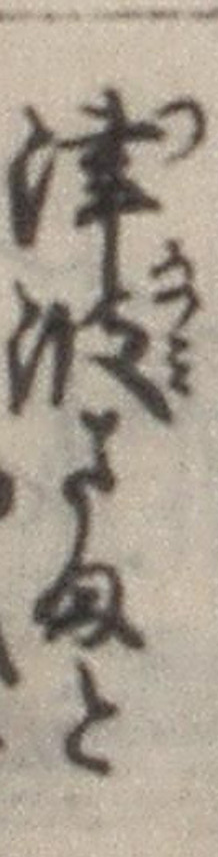津波さまと
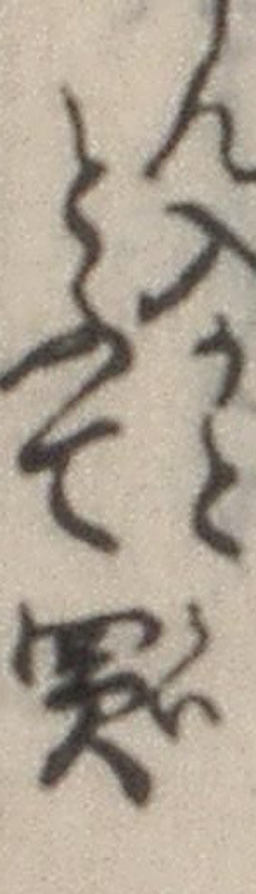とふて買
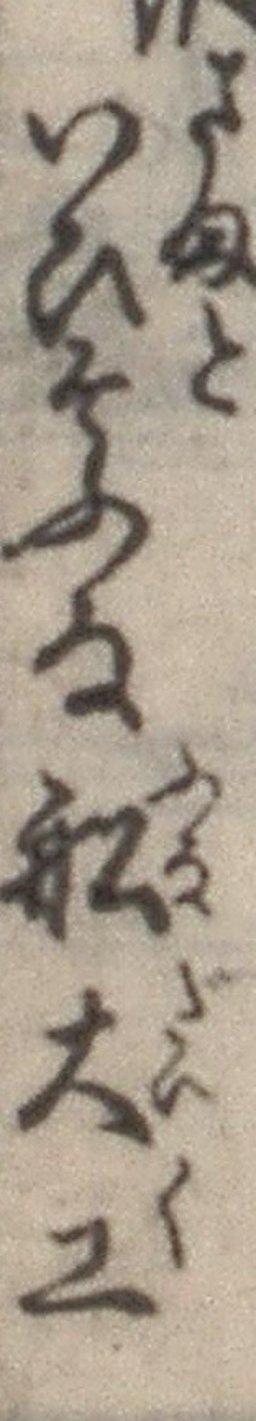いひそふな舩大工
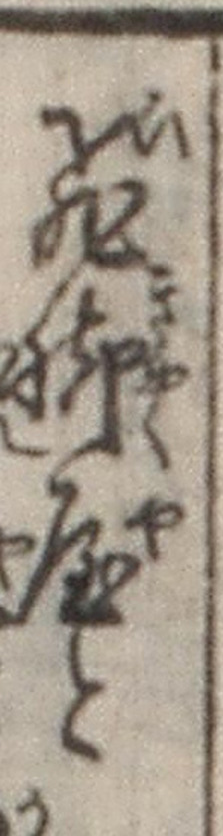飛脚屋と
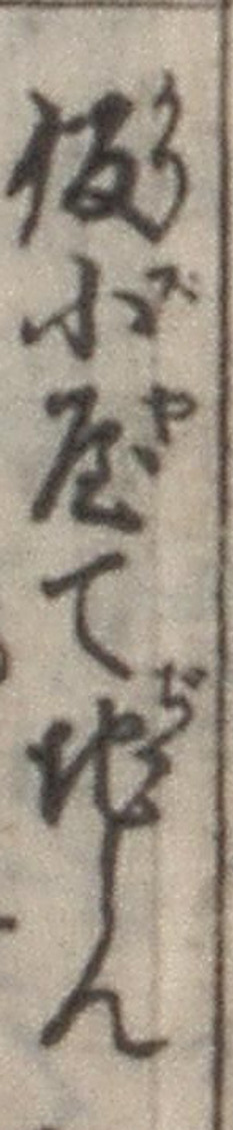仮小屋て地しん
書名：諸國大地震年代記　末代噺種
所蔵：東京大学地震研究所図書室 Earthquake Research Institute Library, The University of Tokyo, JAPAN
